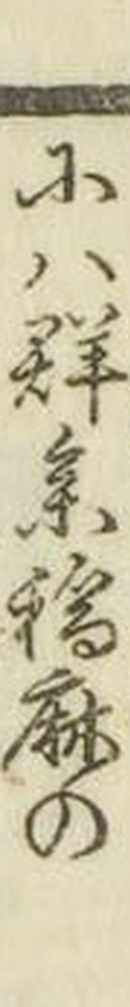には群参稲麻の
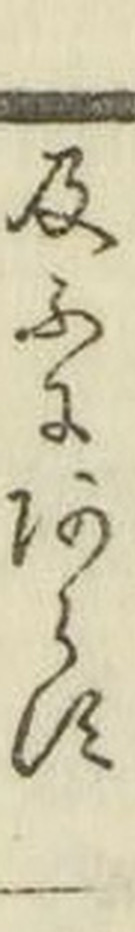及ふにあらす
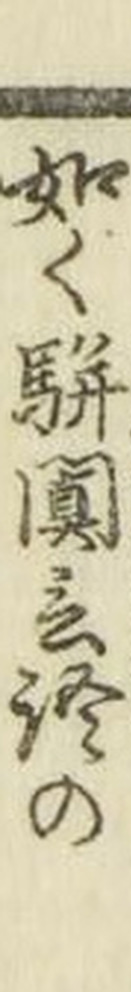如く駢闐言澹の

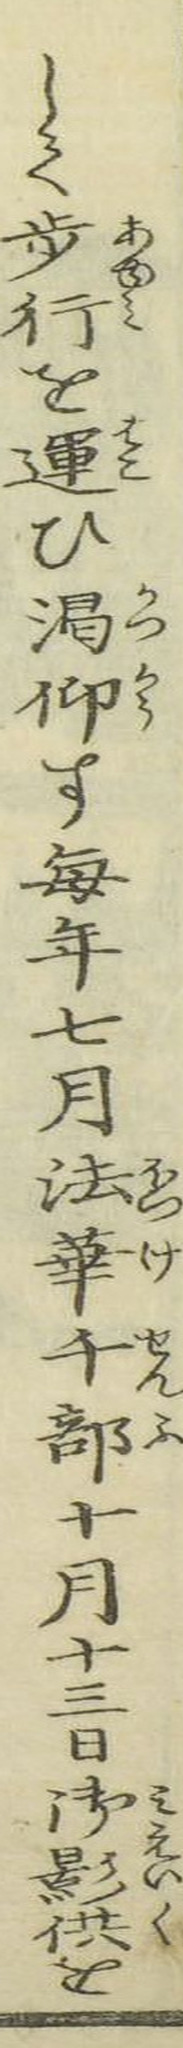して歩行を運ひ渇仰す毎年七月法華千部十月十三日御影供を
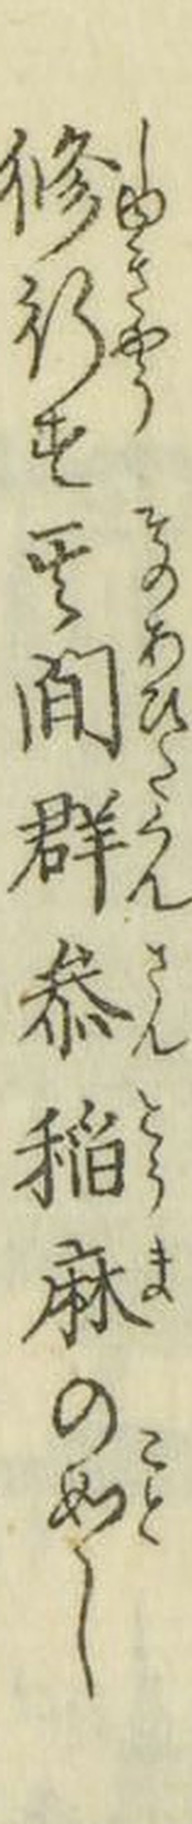修行す其間群参稲麻の如し
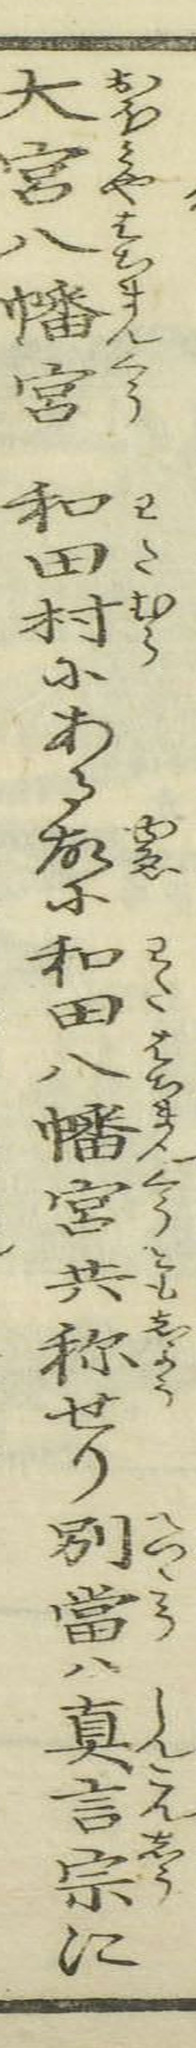大宮八幡宮和田村にある故に和田八幡宮共称せり別当は真言宗に
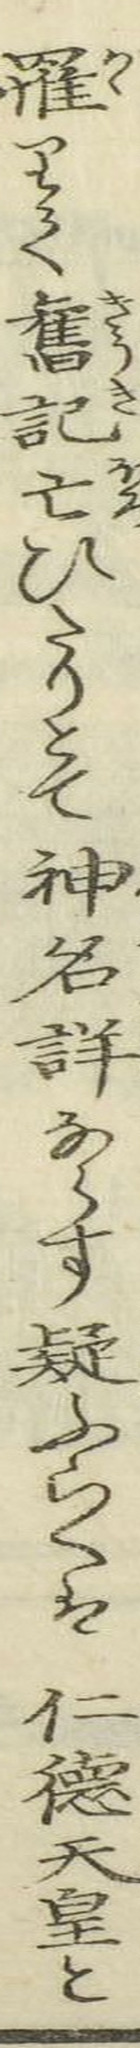罹りて旧記亡ひたりとて神名詳ならす疑ふらくは仁徳天皇と
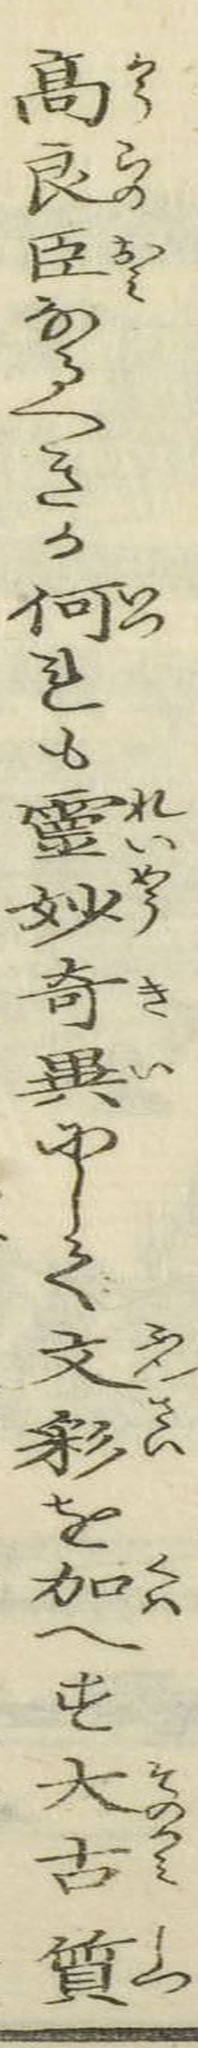高良臣なるへきか何れも霊妙奇異にして文彩を加へす大古質
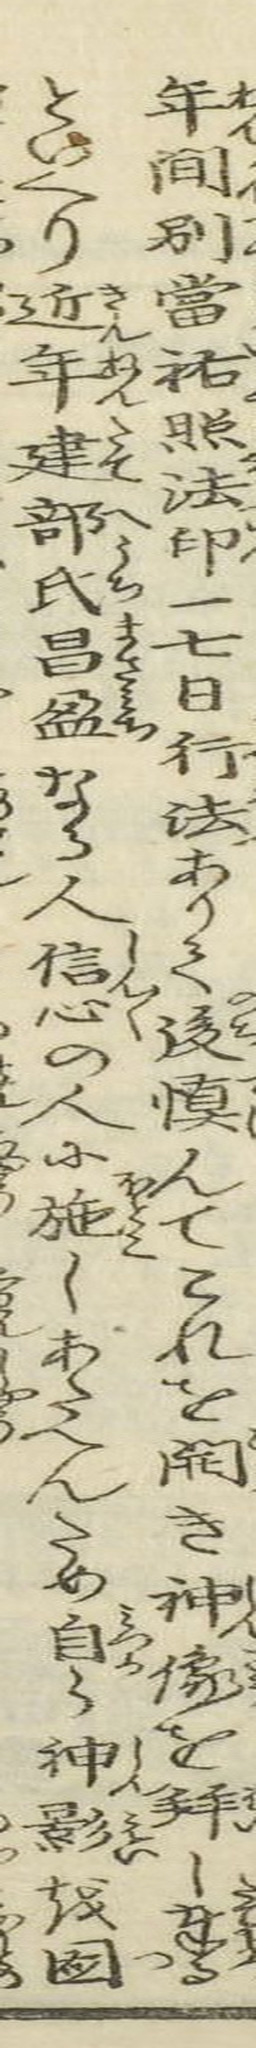といへり近年建部氏昌盈なる人信心の人に施しあたへんため自ら神影を図
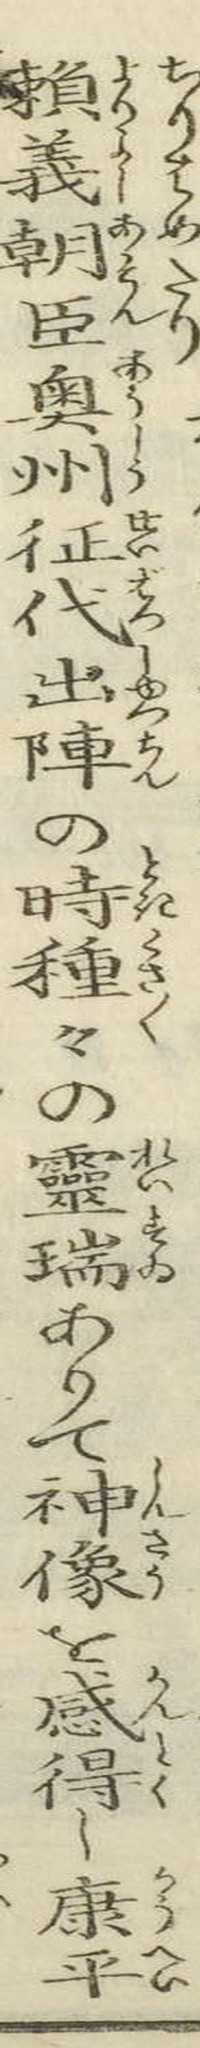頼義朝臣奥州征伐出陣の時種の霊瑞ありて神像を感得し康平
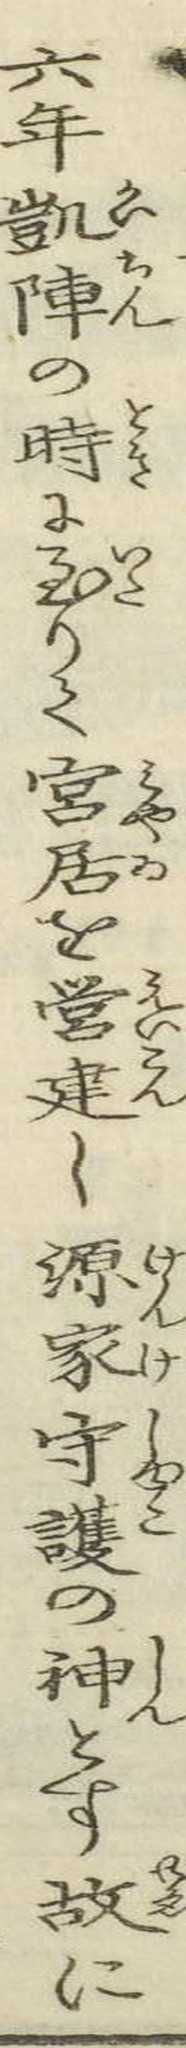六年凱陣の時に至りて宮居を営建し源家守護の神とす故に
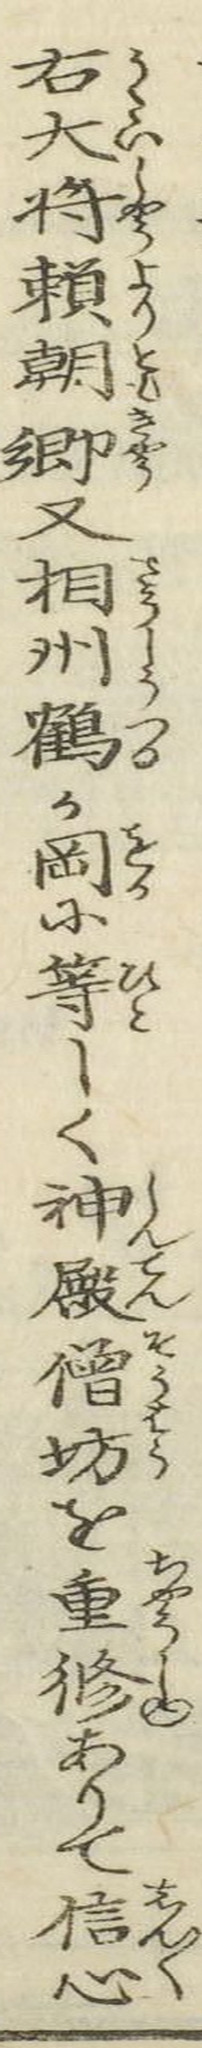右大将頼朝卿又相州鶴か岡に等しく神殿僧坊を重修ありて信心
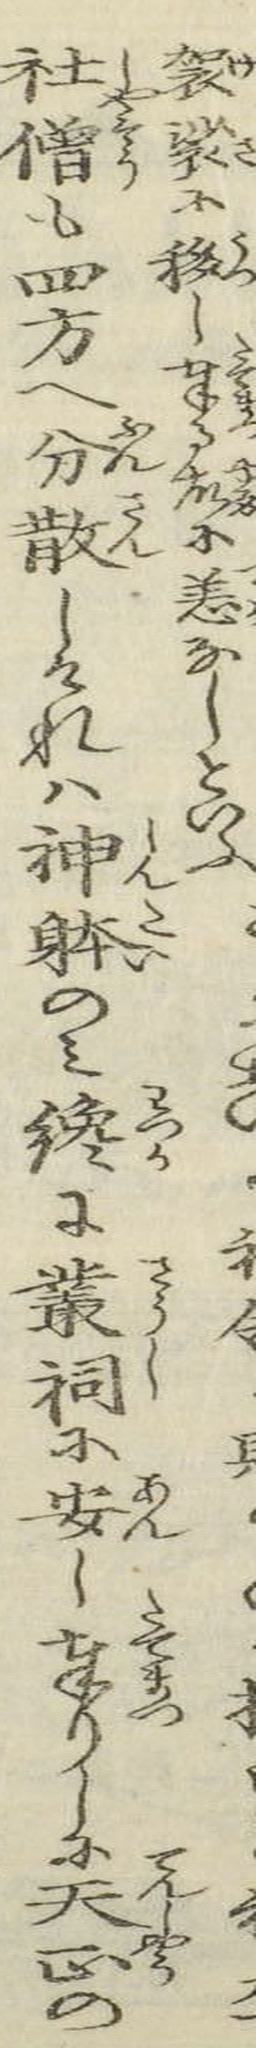社僧も四方へ分散しけれは身体のみ纔に叢祠に安し奉りしに天正の
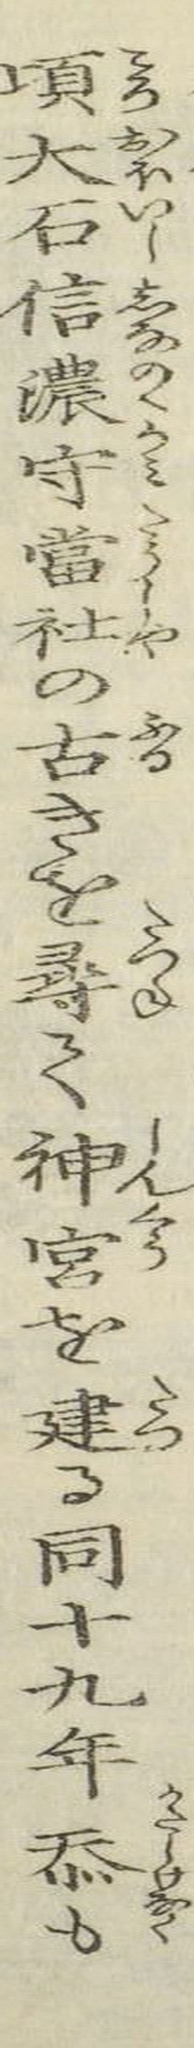頃大石信濃守当社の古きを尋て神宮を建る同十九年忝も
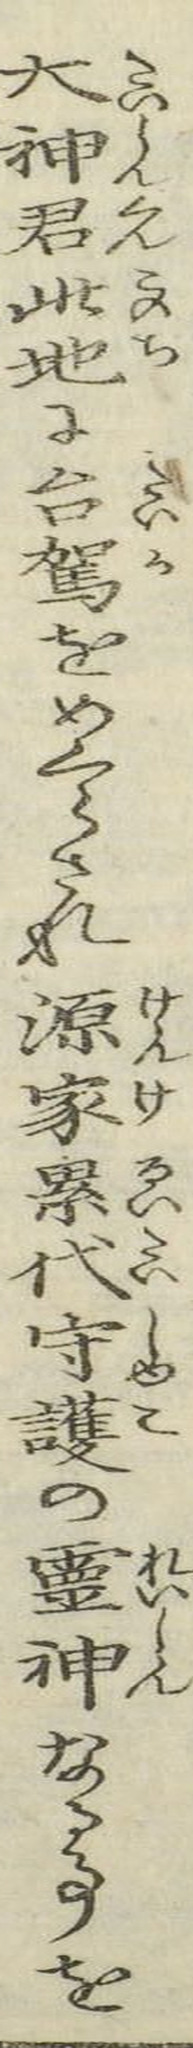大神君此地に台駕をめくらされ源家累代守護の霊神なる事を
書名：江戸名所図会 20巻 巻之11
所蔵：東京学芸大学教育コンテンツアーカイブ
